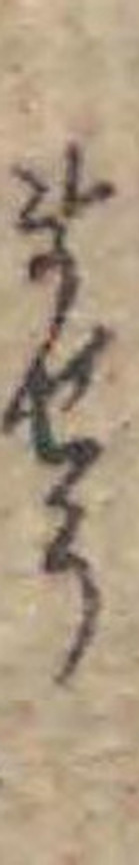ませう
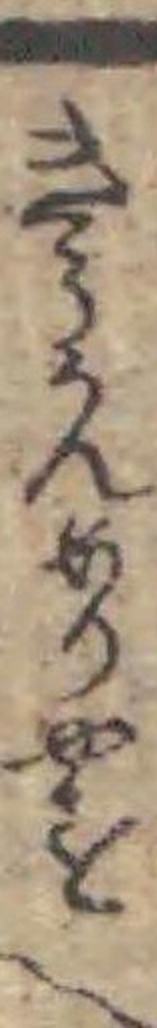きうかんめりやす
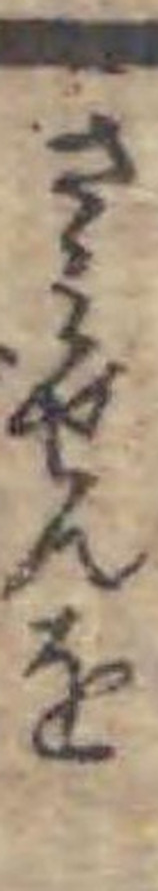さみせんを
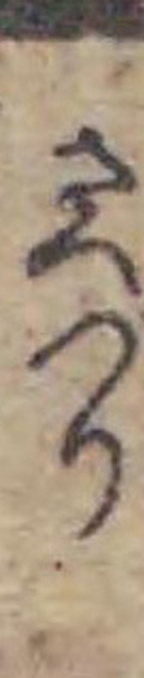さへづり
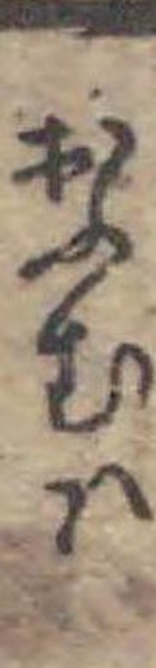おふむは
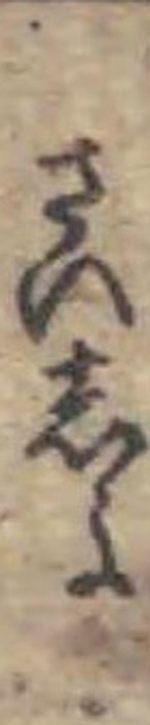さいしよ
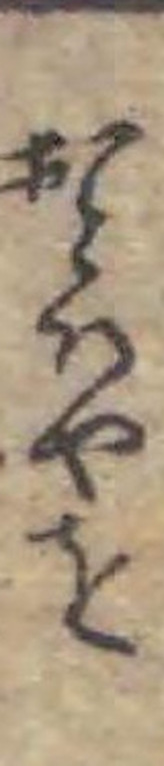おとはやを
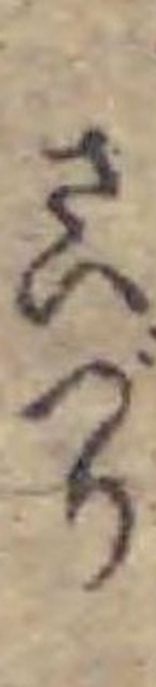さいづり
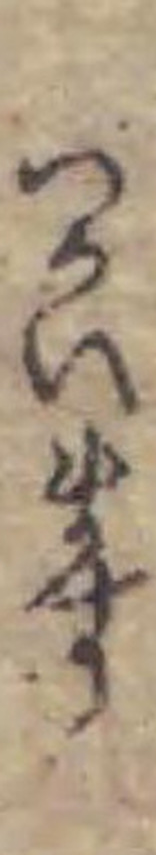つかいます
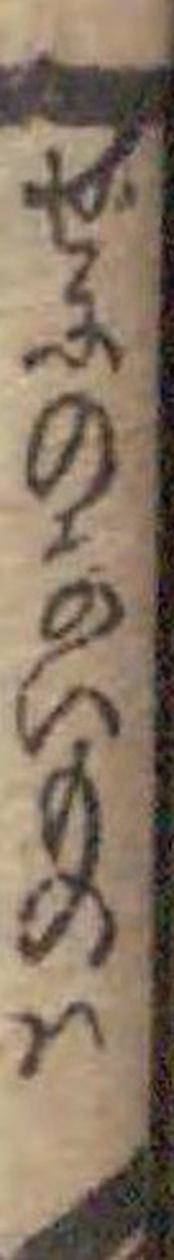ぜにのないものは
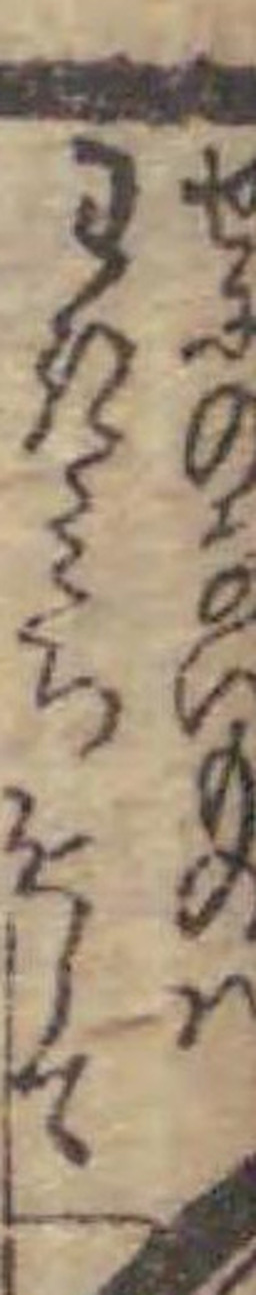わきみちをして
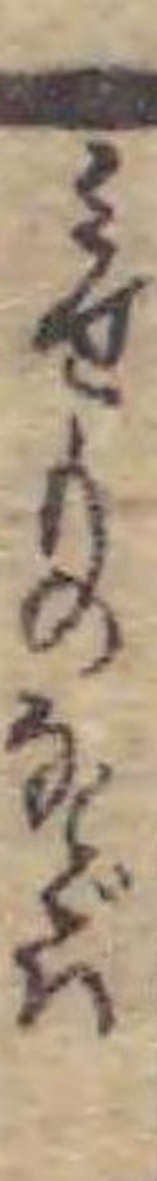みせものなどは
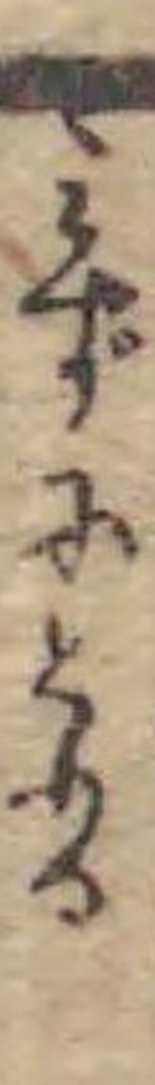みずにとふる
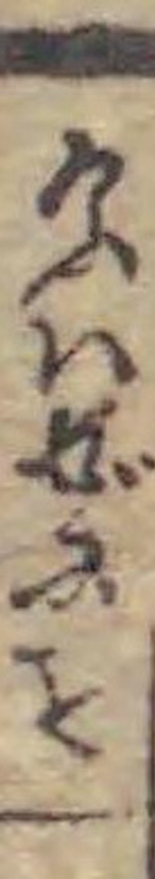けふはぜにを
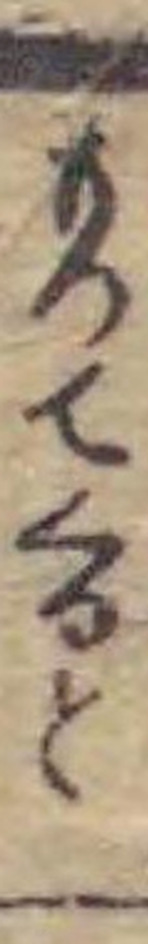もつてくると
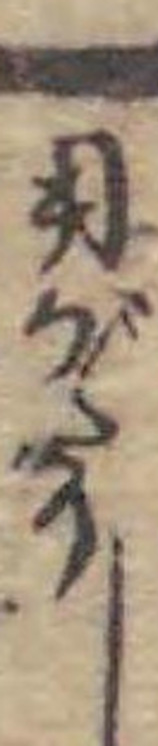用がたり
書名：威気千代牟物語 : 2巻
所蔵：国立国会図書館 National Diet Library, JAPAN
